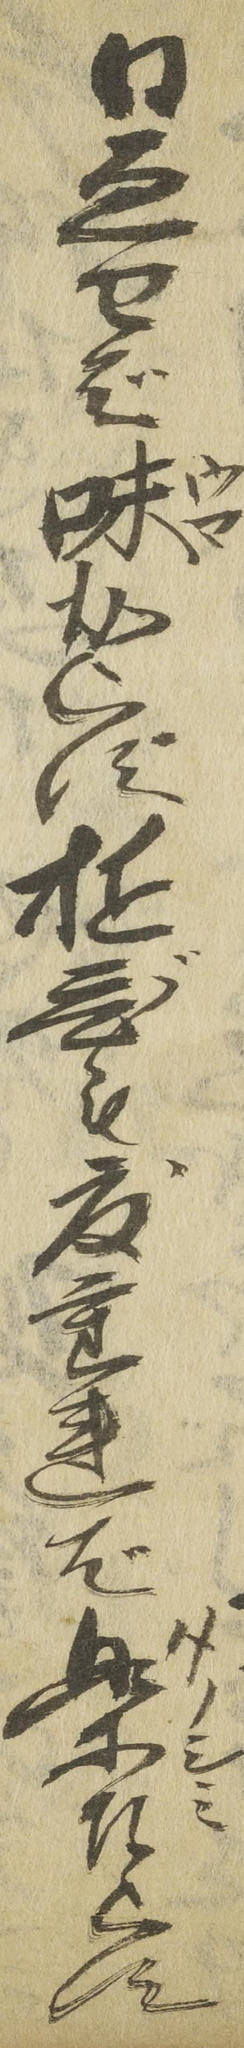日返せば味からず遊びも度重れば楽ならす
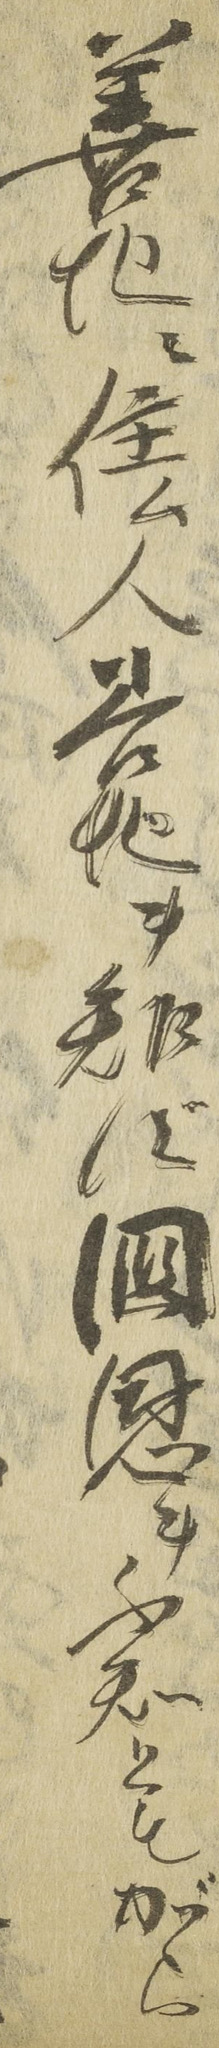善地ニ住ム人善地ヲ知ず国恩ヲ不知ともがら
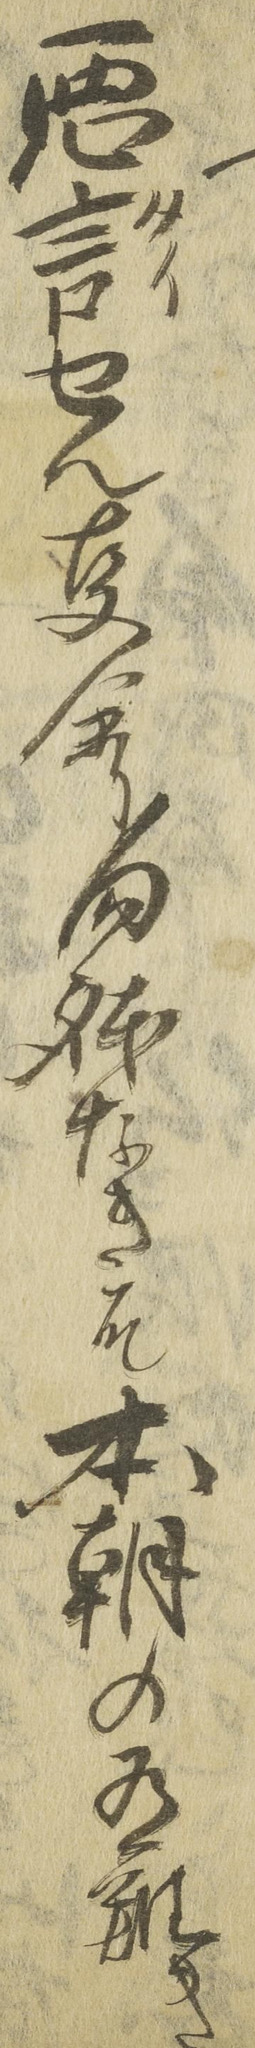悪言せん事余り勿体なき故本朝の有難き
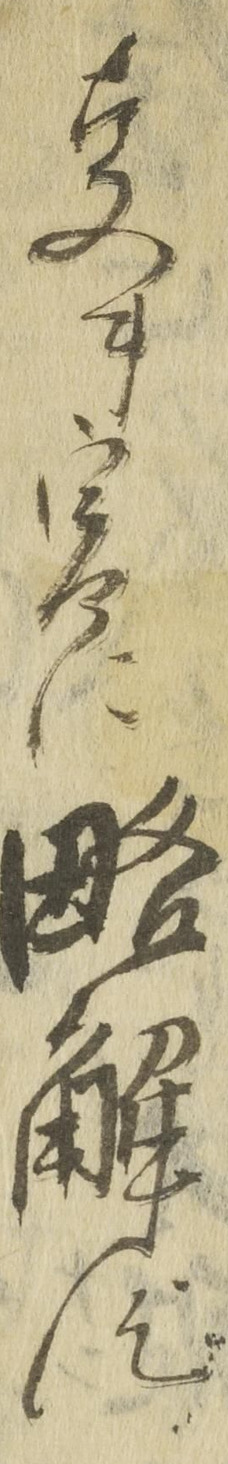事ヲ爰に略解す
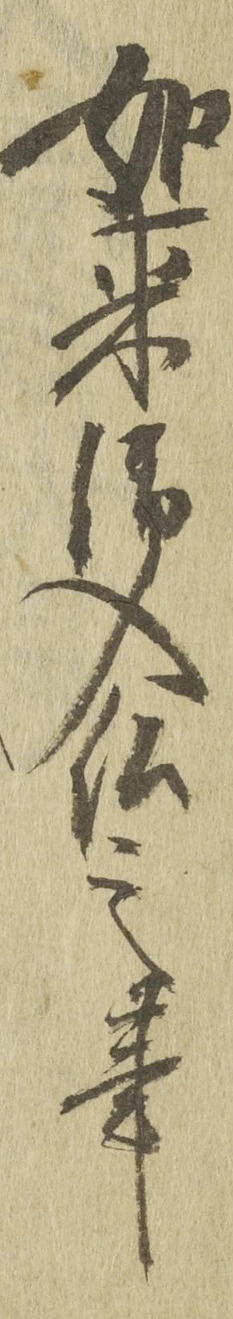如来御入仏の事
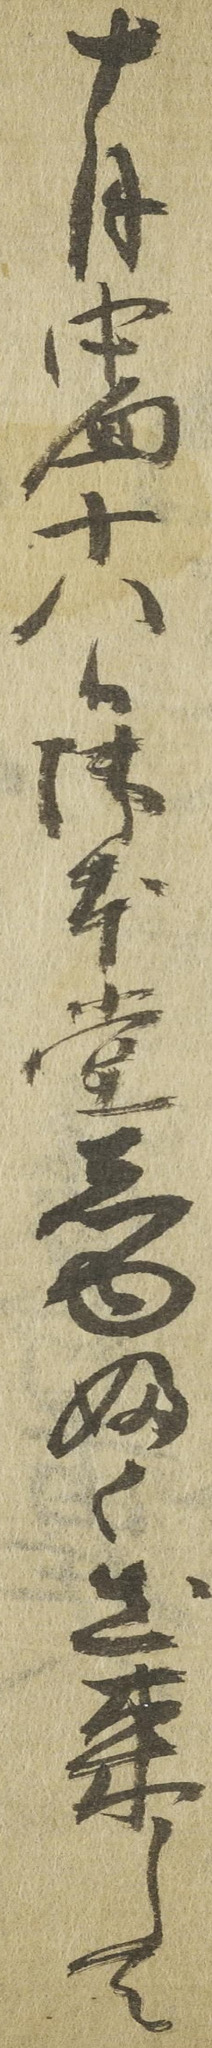十月中旬十八日御本堂しゆふく出来して
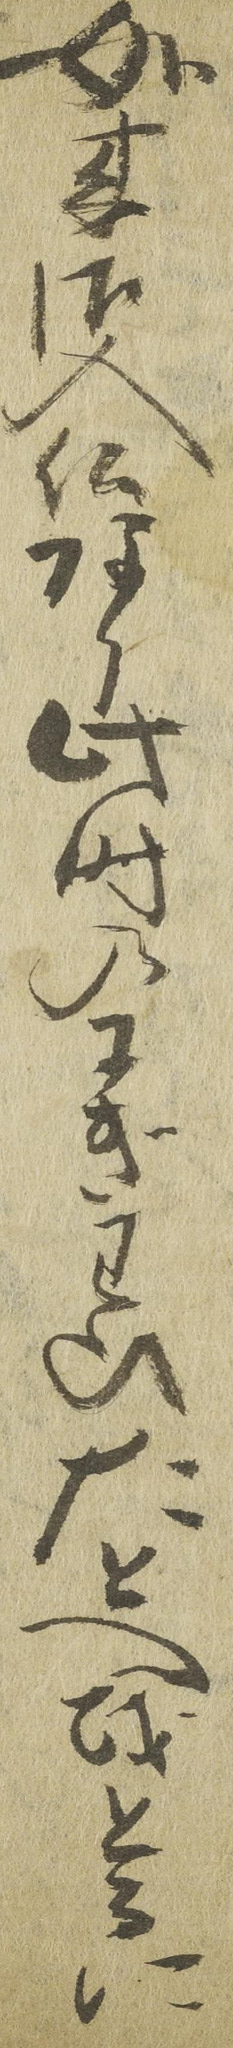如来御入仏なり此時のにぎわひたとへをとるに
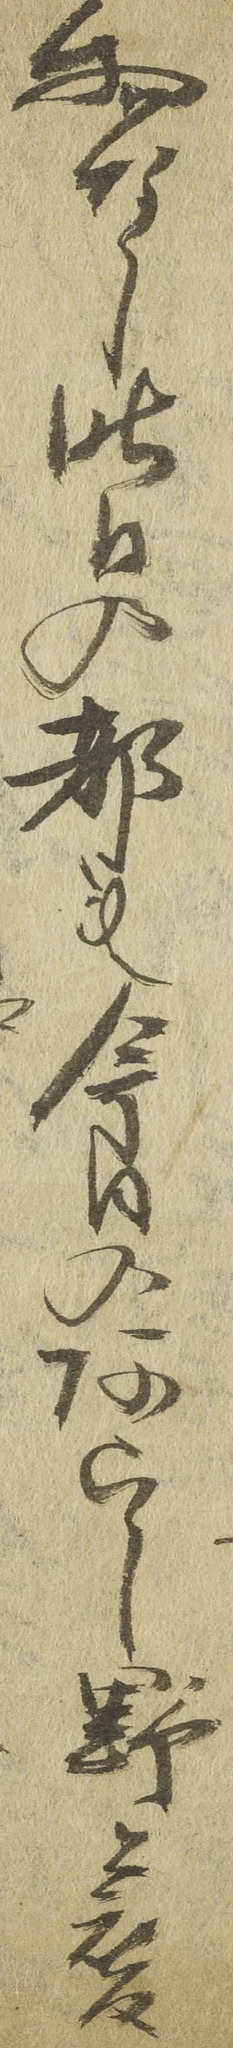物なし昨日の都も今日のあらし野と変
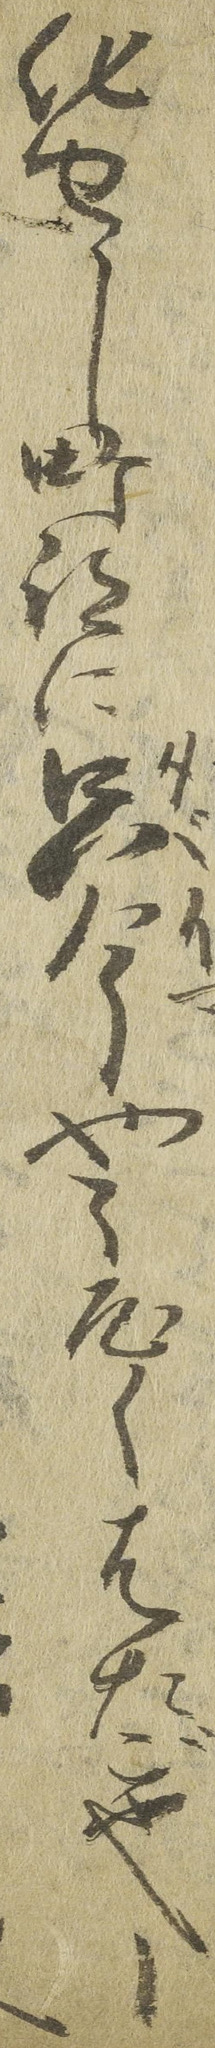化せし町跡に只今やうやくはたごや
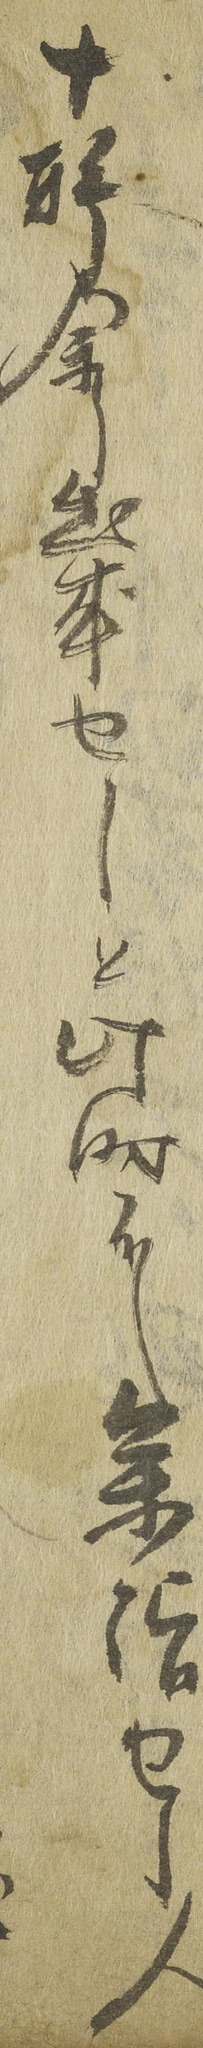十軒余り出来せしと此時ふし参詣せし人
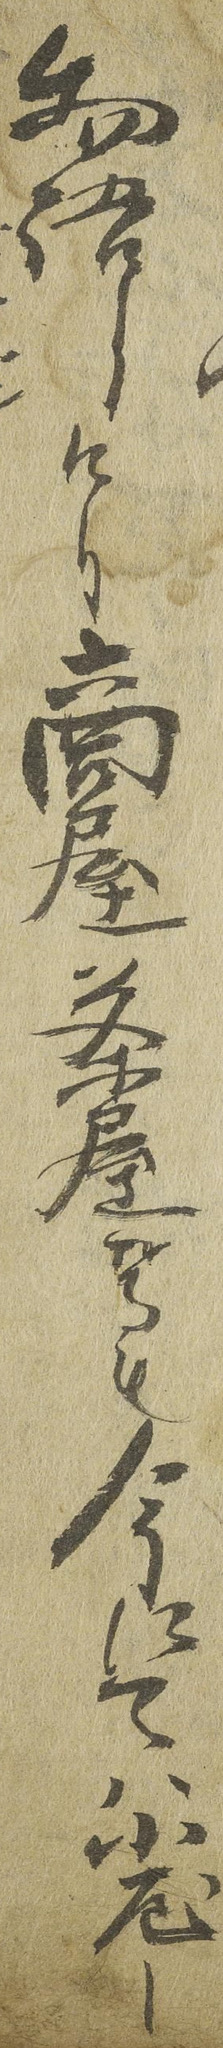物語りけり商屋茶屋等も今にてハ小屋
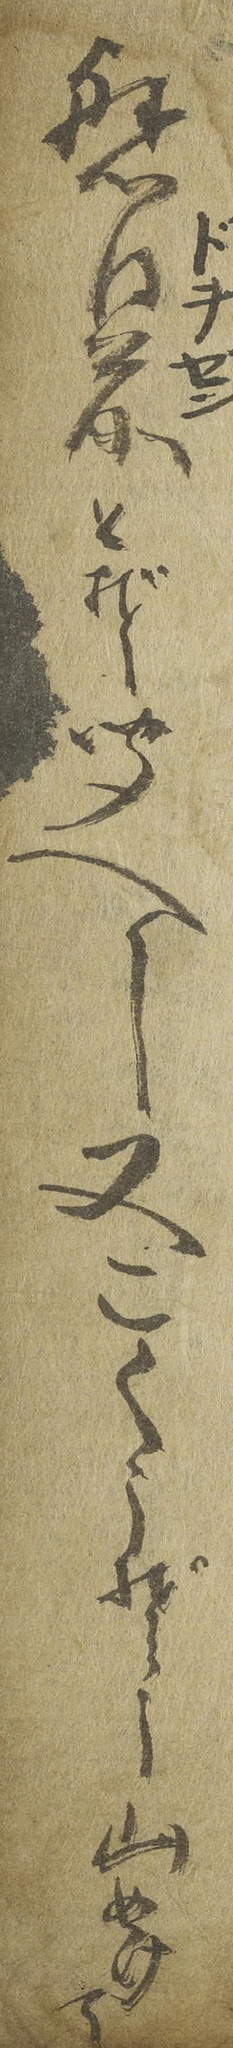懸同前とぞ聞へし又こくうぞう山ぬけて

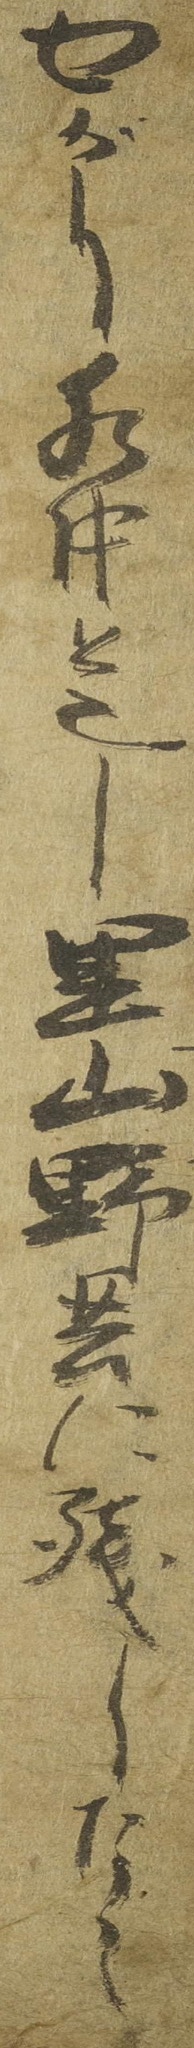せがり水中と也し里山野共に残りなし
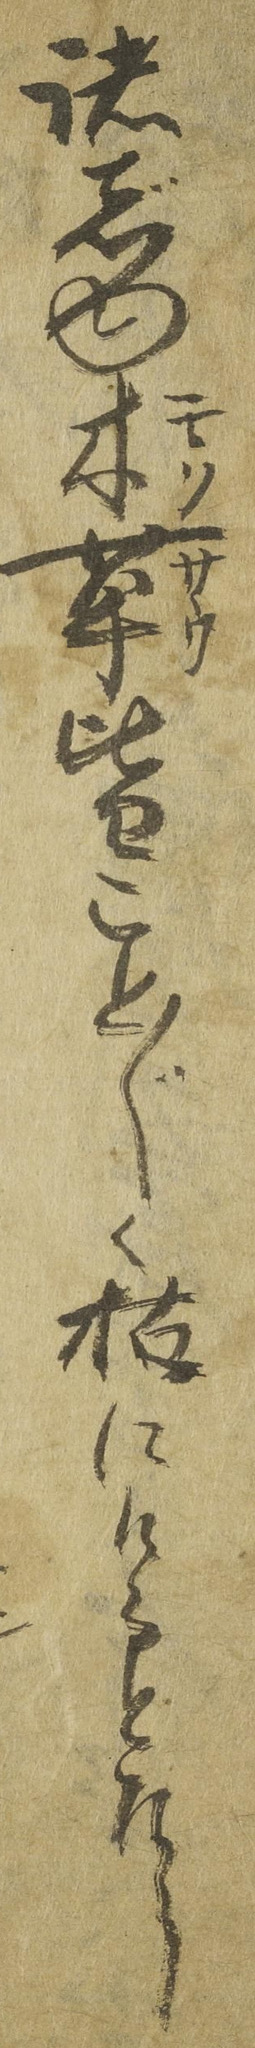諸じゆ木草皆こと〴〵く枯にけるとなり
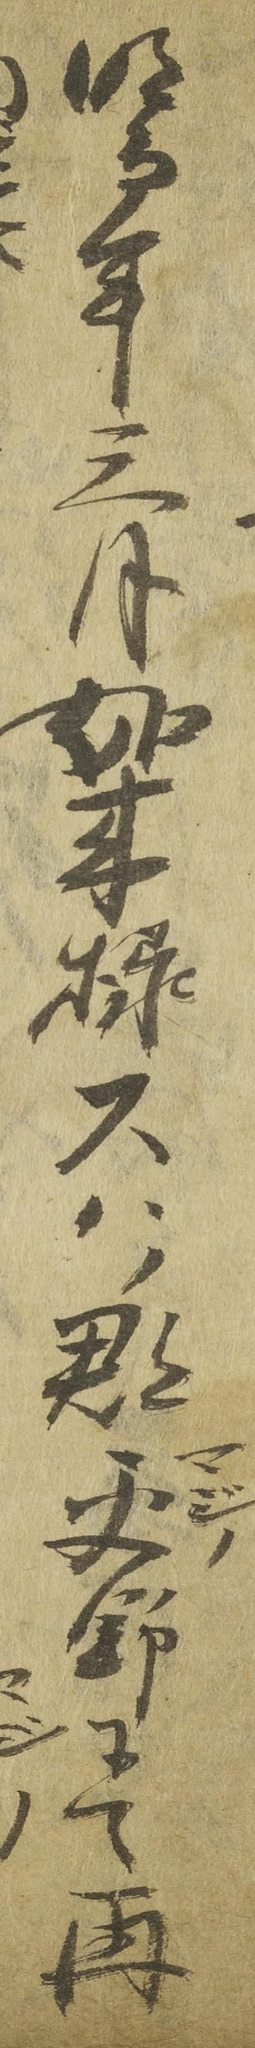明る年三月如来様スハノ郡交野にて再
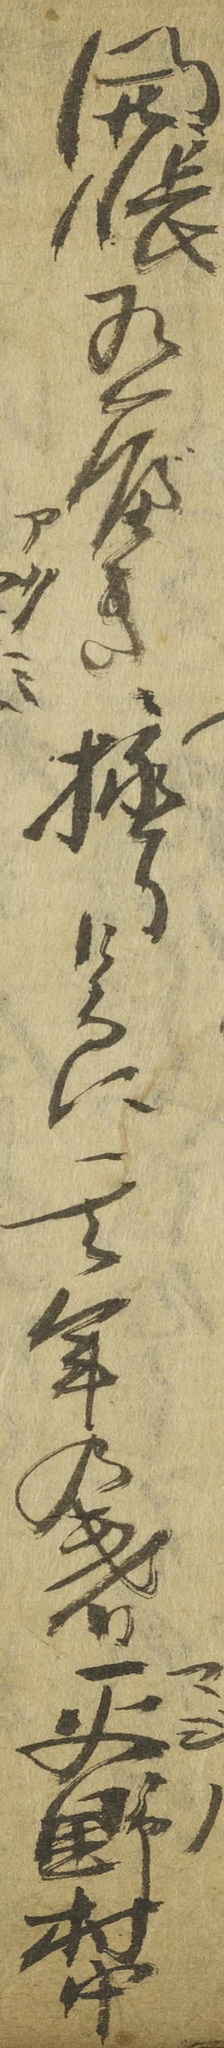開帳有べきニ極りけるに其年の春交野村中
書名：善光寺地震聞書
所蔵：東京大学地震研究所図書室 Earthquake Research Institute Library, The University of Tokyo, JAPAN
